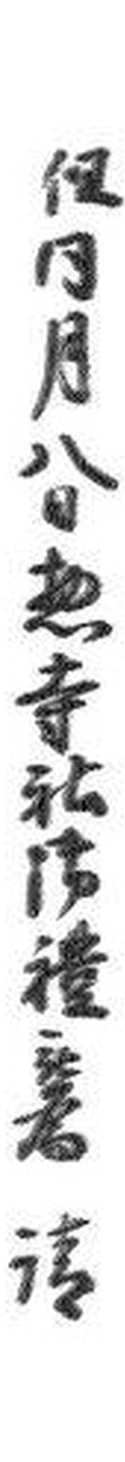但同月八日惣寺社御礼被為請
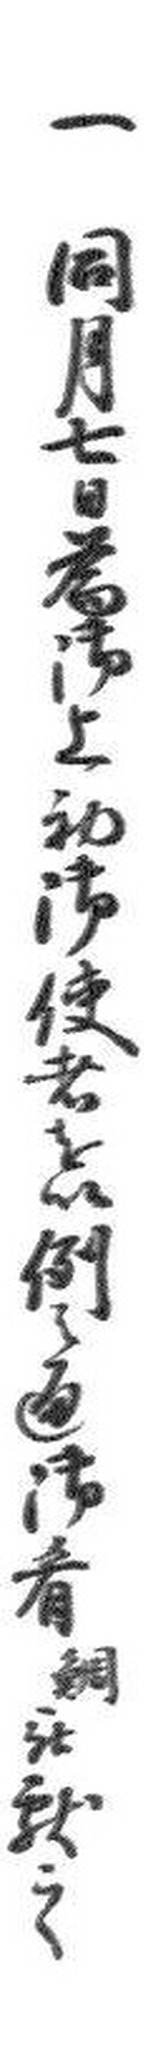一同月七日為御上初御使者を以例之通御肴鯛被献之
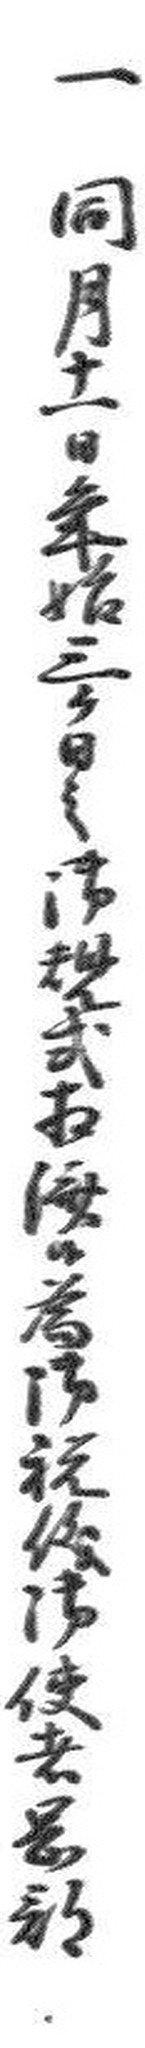一同月十一日年始三ケ日之御規式相済候為御祝儀御使者岡部
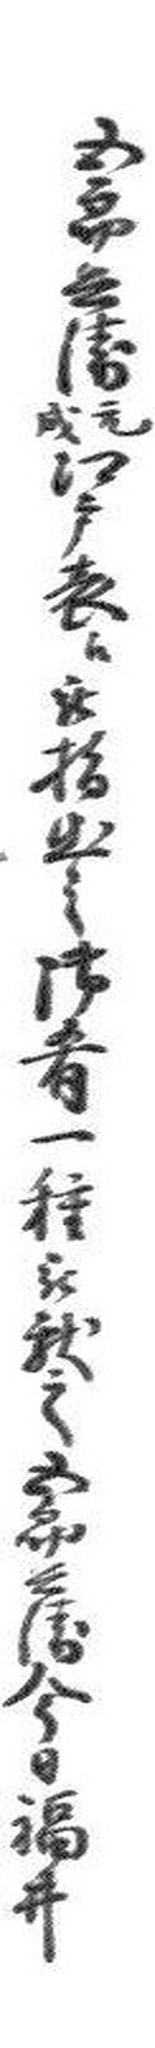五郎兵衛元成江戸表江被指出之御肴一種被献之五郎兵衛今日福
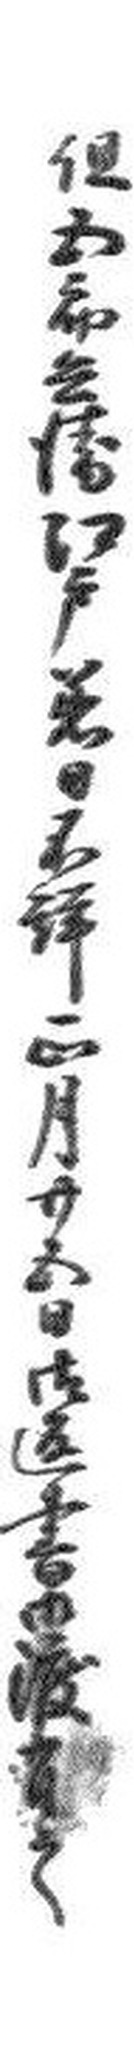但五郎兵衛江戸着不詳正月廿五日御返書御渡有之
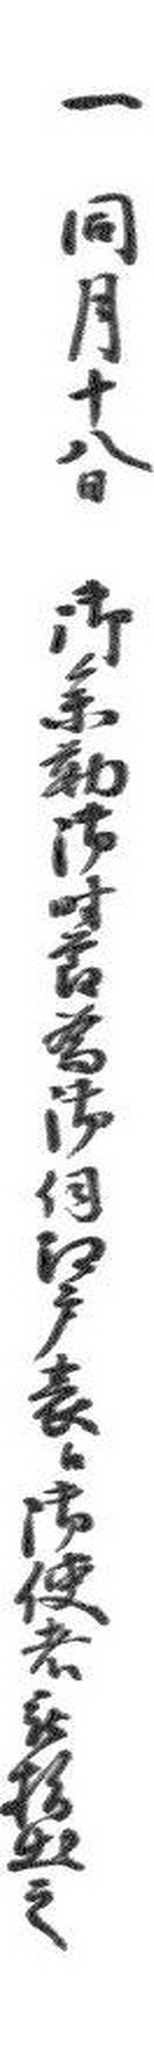一同月十八日御参勤御時節為御伺江戸表江御使者被指出之
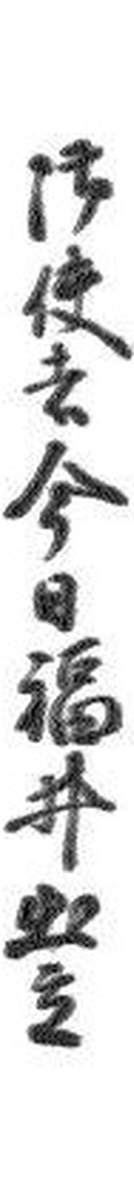御使者今日福井出立
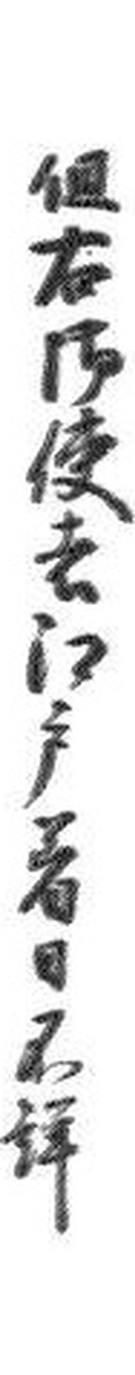但右御使者江戸着不詳

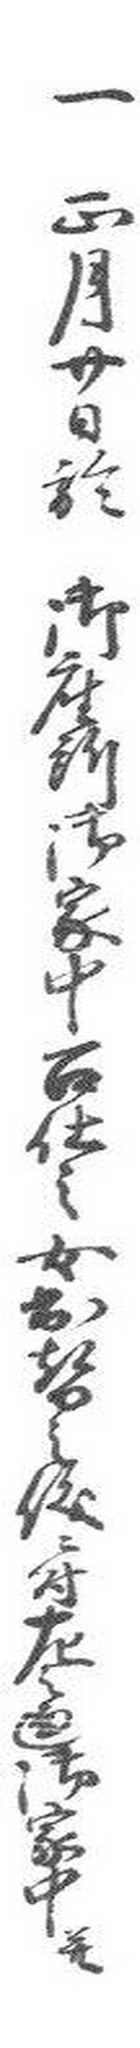一正月廿日於御座所御家老中召仕之女出替之儀ニ付左之通御家老中
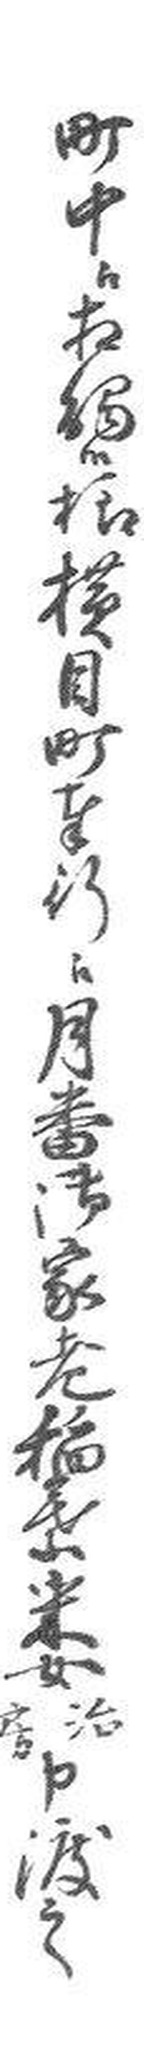町中江相触候様町奉行江月番御家老稲葉采女治房申渡之
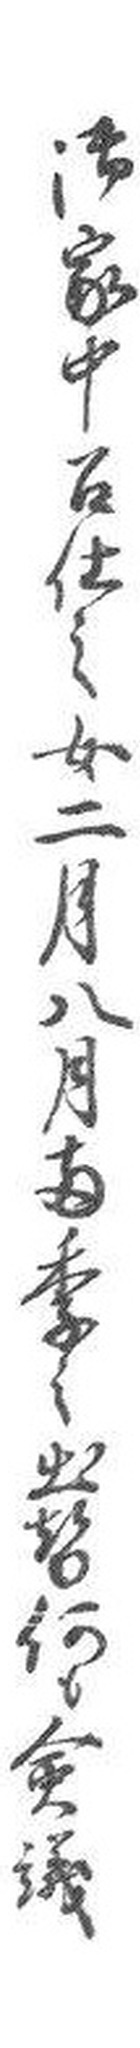御家中召仕之女二月八月両季之出替何も僉議
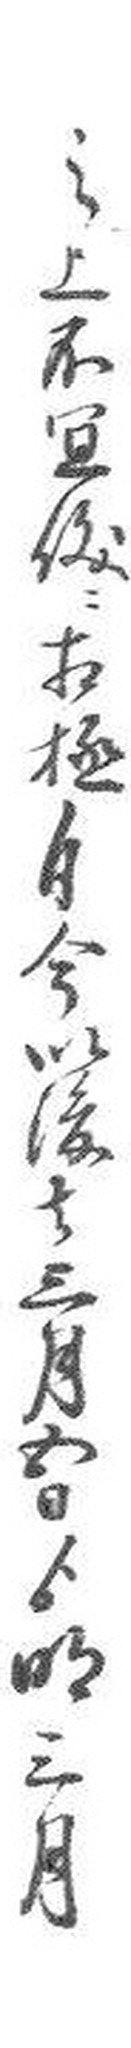之上不宜儀ニ相極自今以後者三月五日ゟ明三月
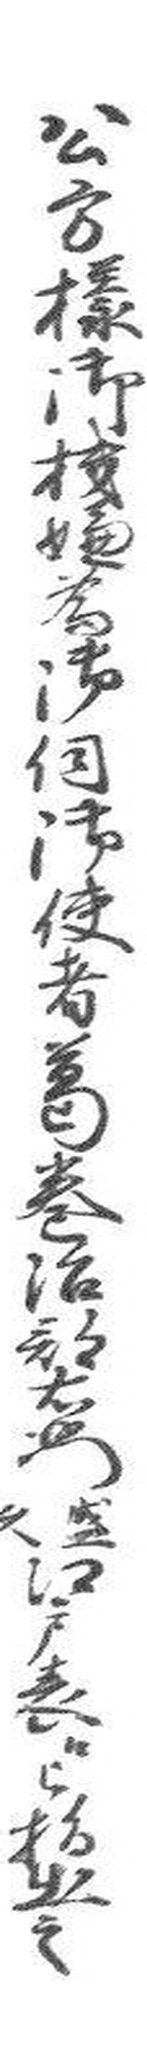公方様御機嫌為御伺御使者葛巻治部右衛門盛矢江戸表被指出之
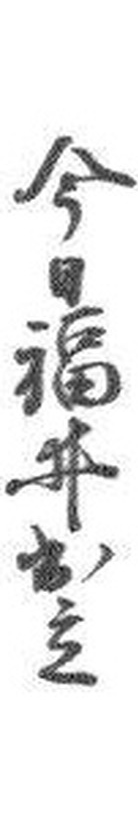今日福井出立
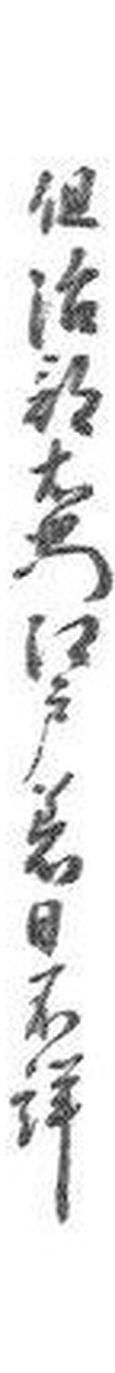但治部右衛門江戸着不詳
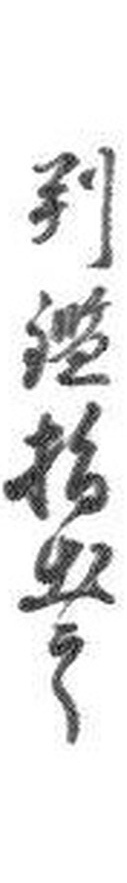判鏡指出之
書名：家譜 十一 昌親公 従延宝二年到延宝四年八月
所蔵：福井県文書館 Fukui Prefectural Archives
